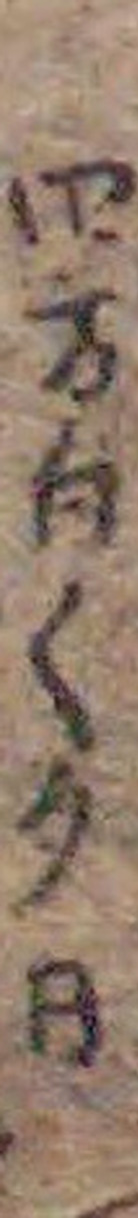四方白く夕日
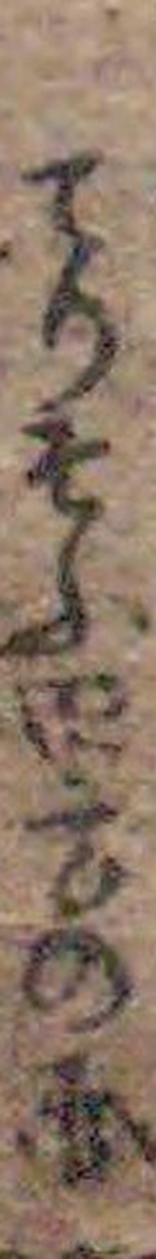てりそふ四方の赤
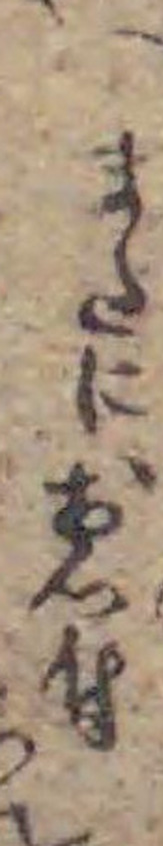またにお心付
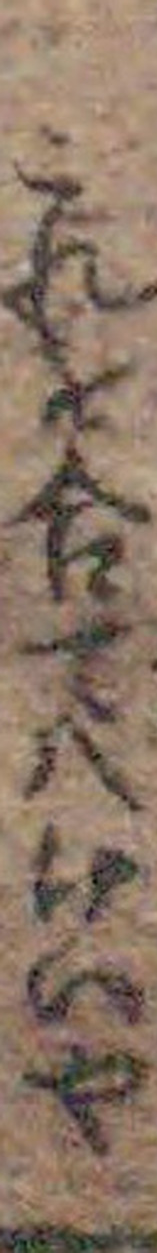これを合て八けいや
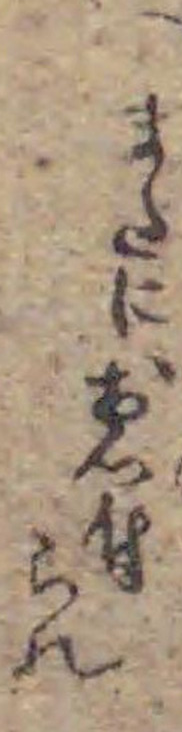またにお心付
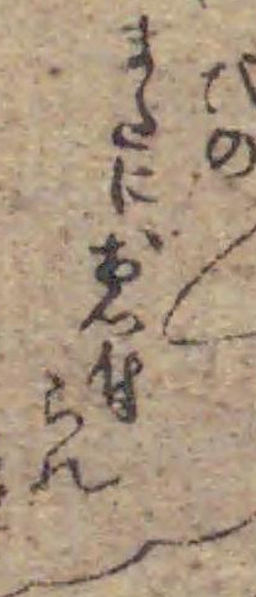またにお心付
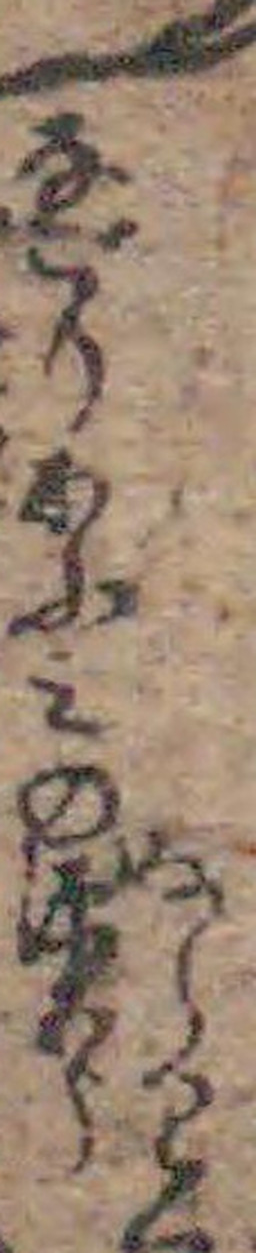なごりあふみの源五郎
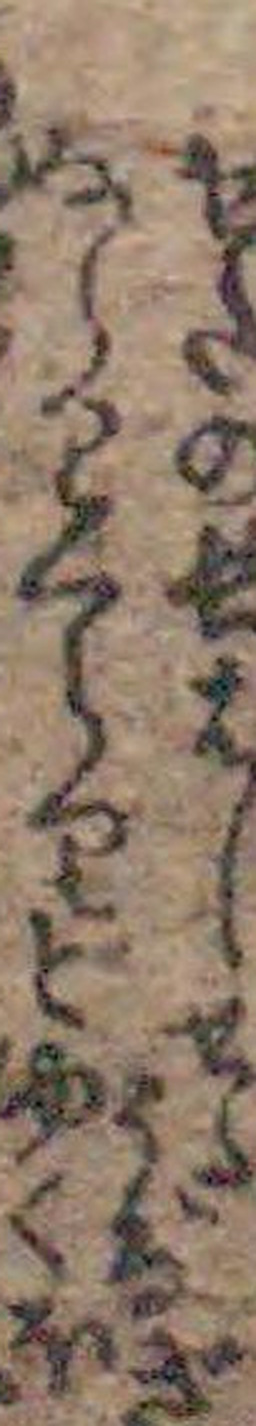ぬらりくらりとゆくほ
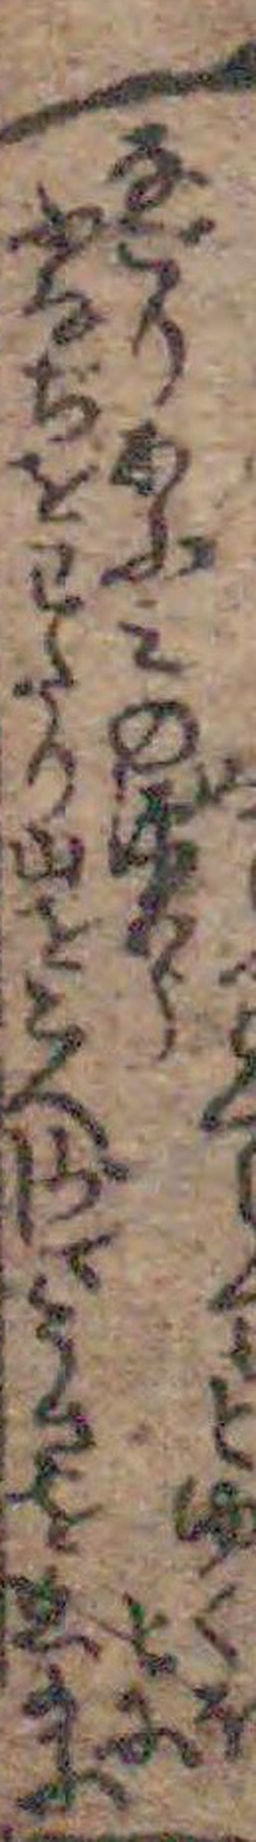ふなぢをわたり山をこへ少はうさを忘給ふ
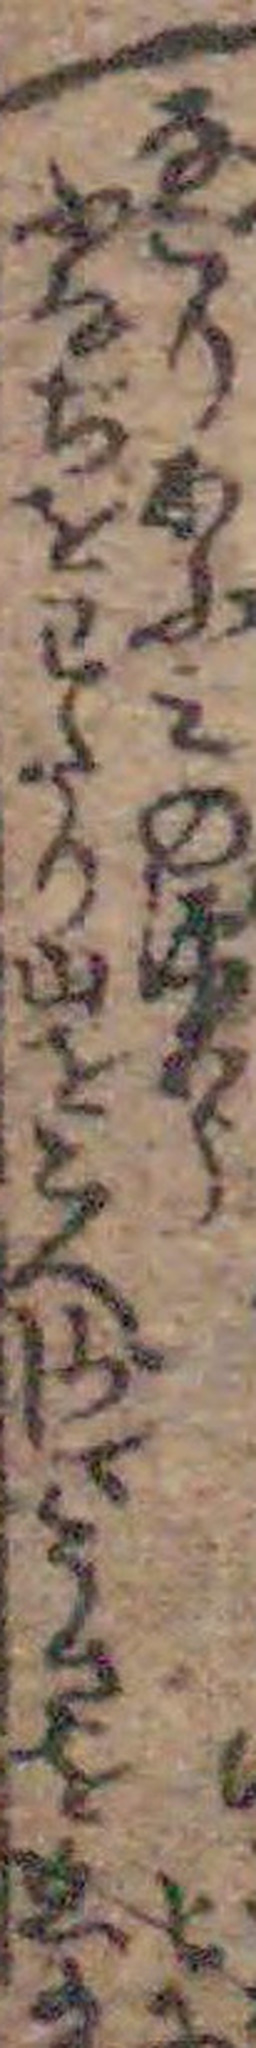ふなぢをわたり山をこへ少はうさを忘給ふ

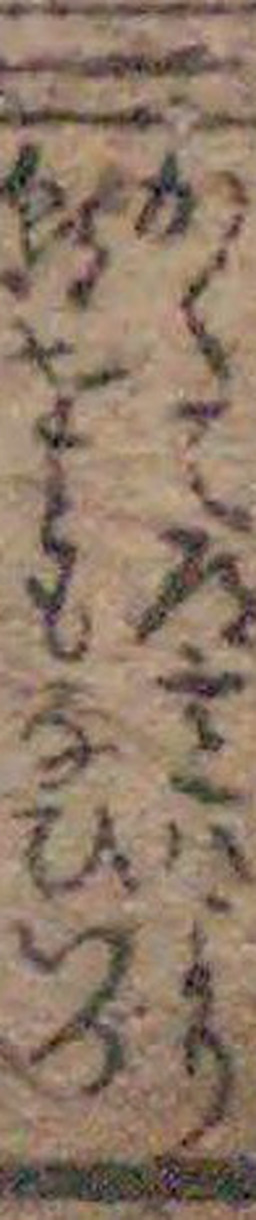朝をともなひいづ
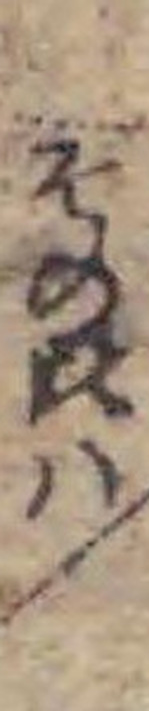その比は
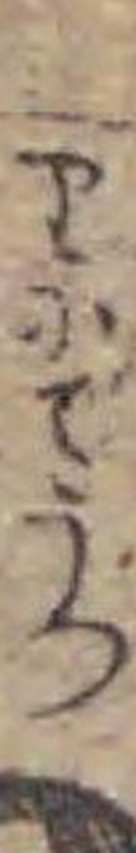りにてうつ
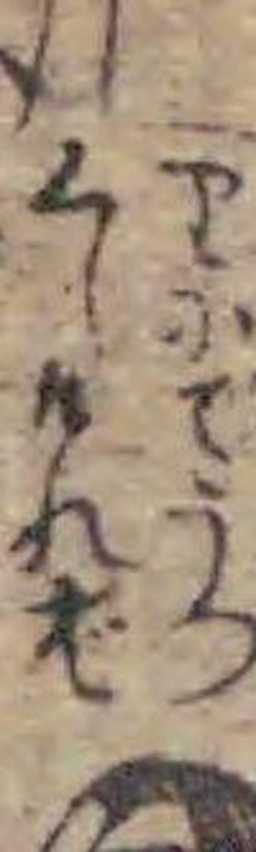くしければ
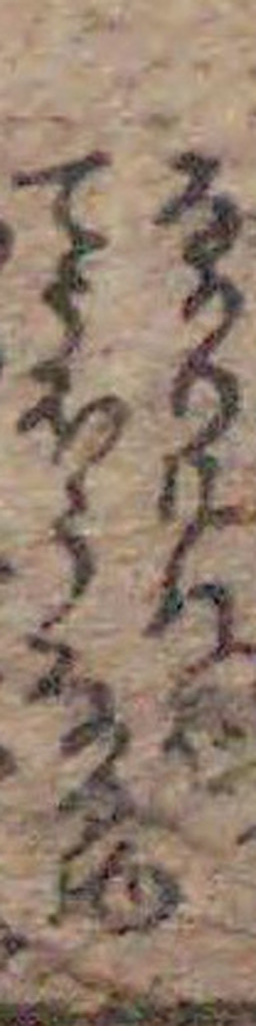てうほうなる物
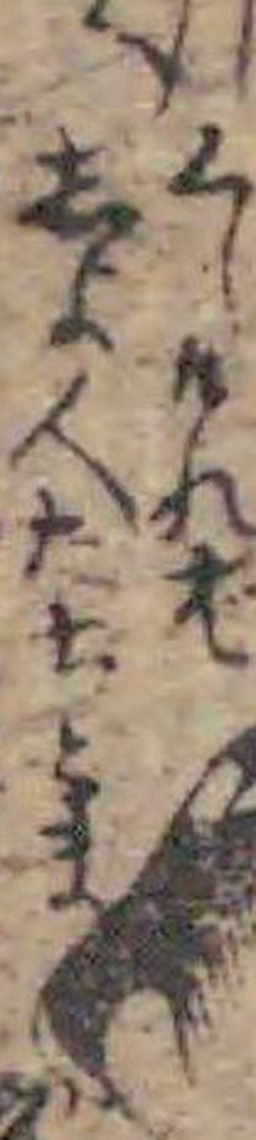しよ人たちとま
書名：三舛増鱗組 : 3巻
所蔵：国立国会図書館 National Diet Library, JAPAN
